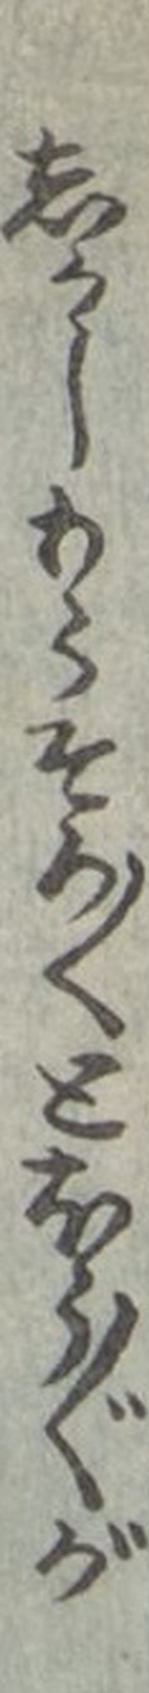しかしもうそろ〳〵とほう〴〵が
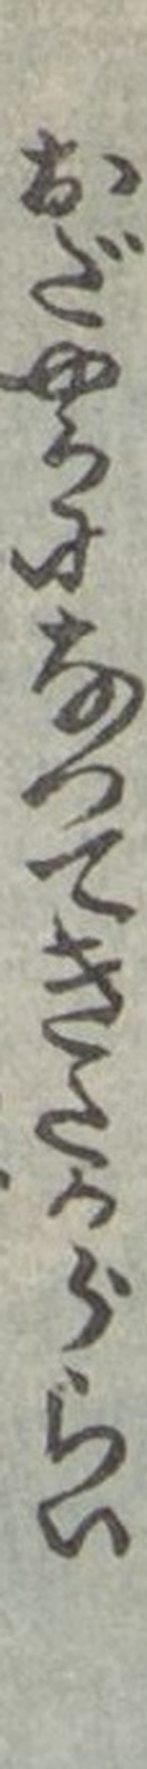おだやかになつてきたかららい
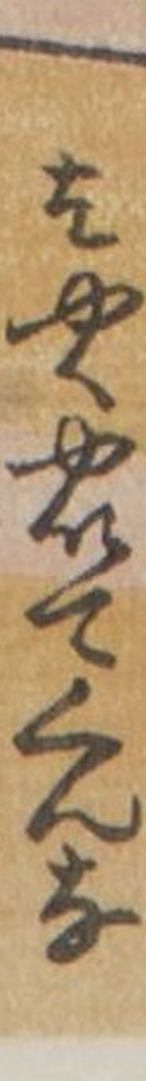はやくやいてくんな
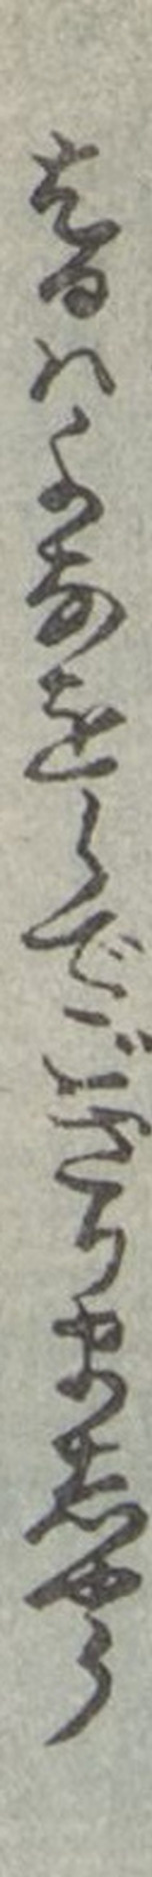はるはよなをしでござりましやう
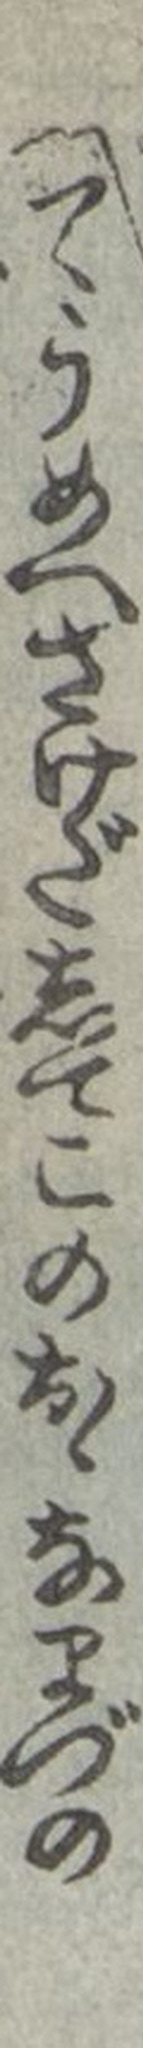〽アゝうめへさけだしてこのおゝなまづの
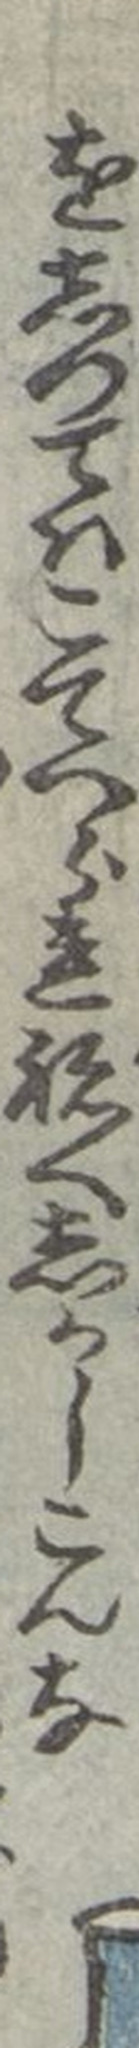をしつてはこてへられねへしかしこんな
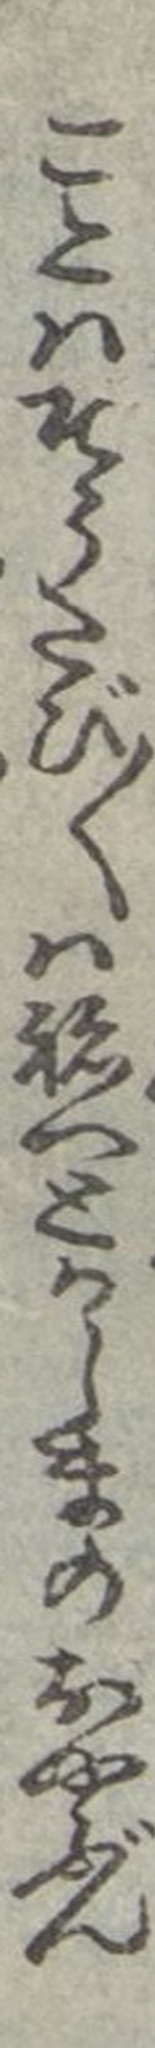ことはそうたび〳〵はねへとかしまのおやぶん
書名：ほね抜どぞう／なまづおなんぎ大家場焼
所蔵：あいおいニッセイ同和損保株式会社
